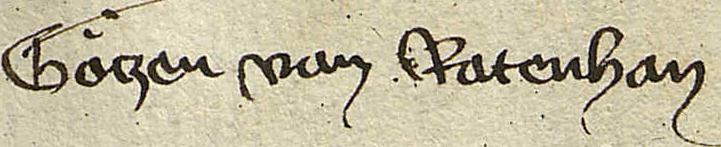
Göcʒen vom Rotenhan
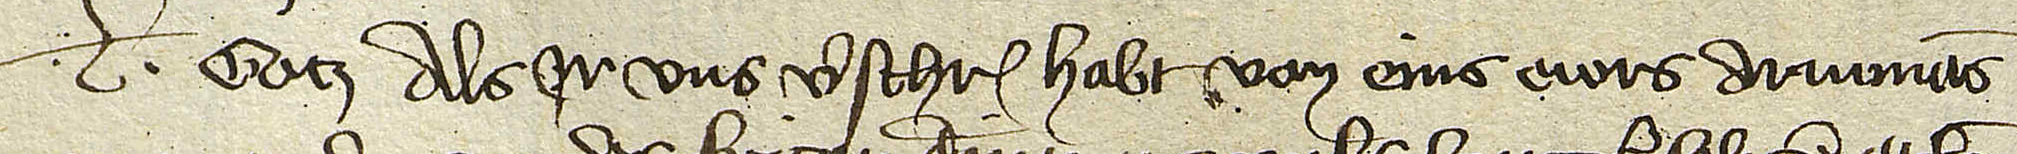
. L* . Göcʒ Als Ir vns v*ſchr* habt von eins ewrs Armmas*
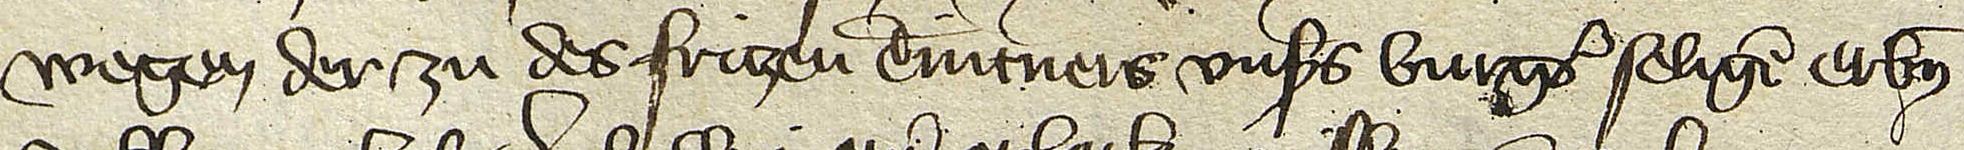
wegen der cʒu des fricʒen Tintners vnſ*s burgs* ſelige* erbn*
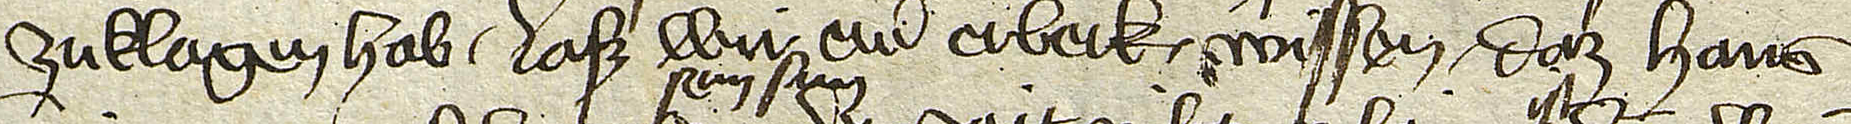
cʒuklagen hab / Laſʒ wir ew* erberk* / wiſſen / daʒ hans
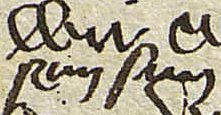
ſein ſun
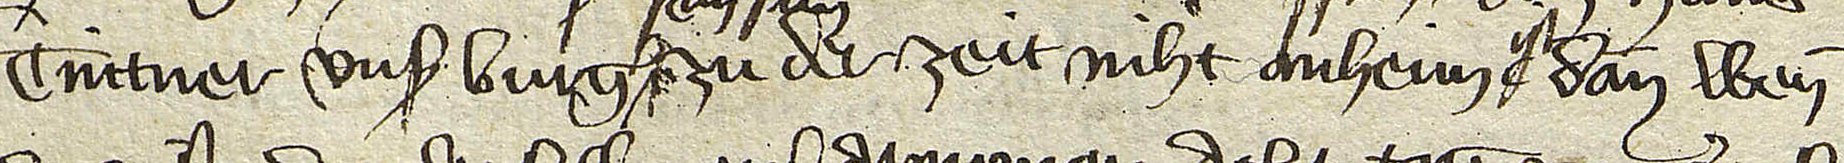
Tintner vnſ* burg* cʒu der cʒeit niht anheim / dan* wen*
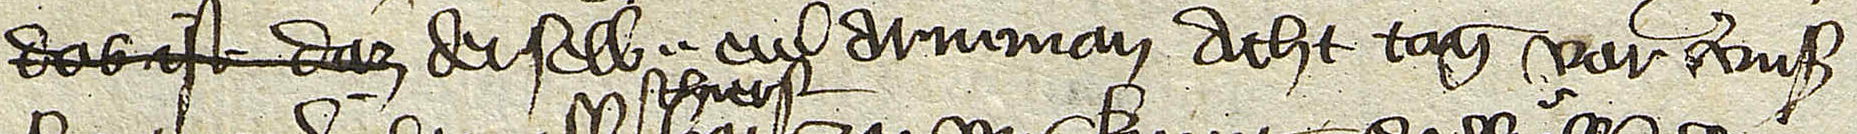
das iſt daʒ derſelb ~ ew* Armman Acht tag vor vnſ*
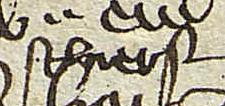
ſchierſt
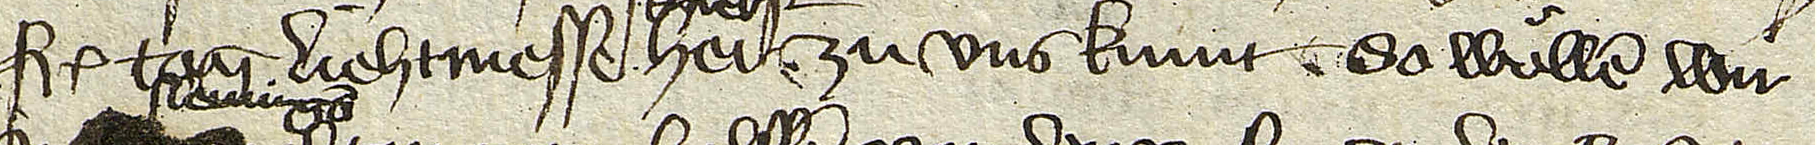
fr* tag liehtmeſſe* her cʒu vns kumt / So wölle* wir
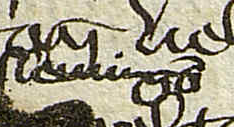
ſlewnigs
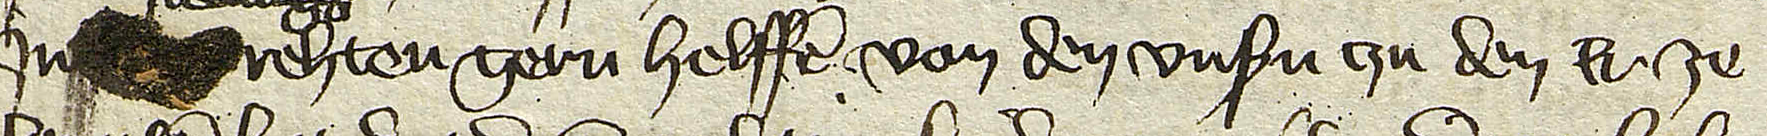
Im %%%%% rehten gern helffe* von den vnſ*n cʒu den Er cʒe
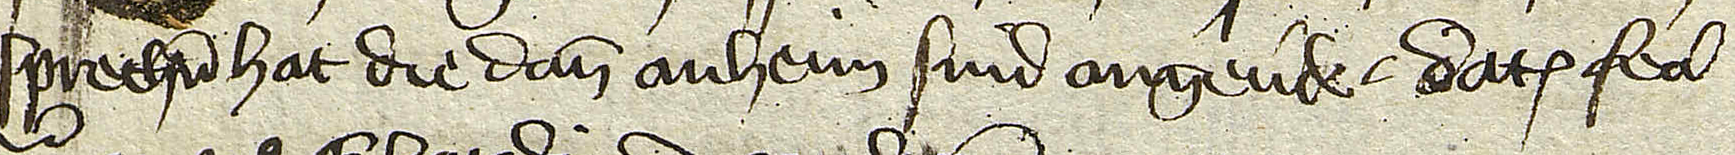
ſprechn* hat die dan* anheim ſind ongeu*de / dat* fea*
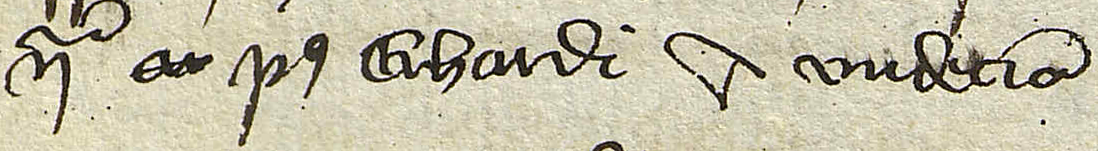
ii* a p* Erhardi A vndecio*
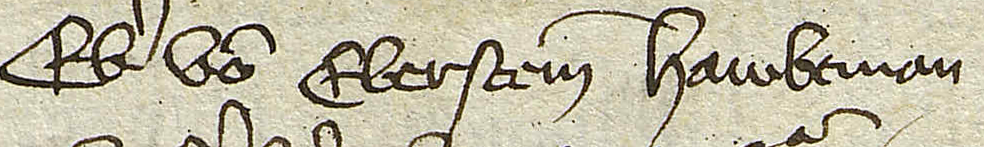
Eb* vo* Eberſtein* hawbtman
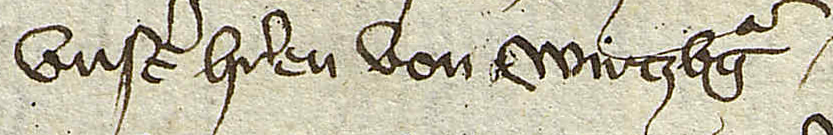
vnſs* hr*en von wircʒb*g /
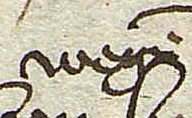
wege*
